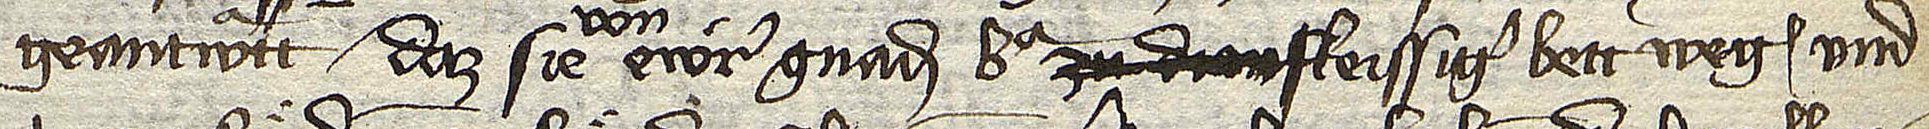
geantwtt* / daʒ ſie eẅr* gnad* b* ʒu dien fleiſſig* bett weg* vnd
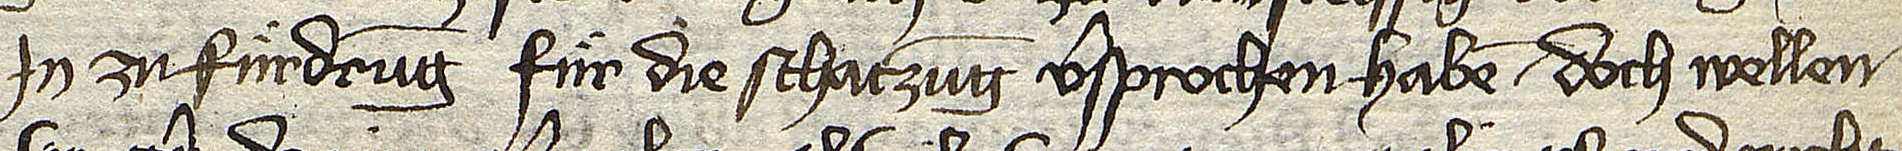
In ʒu fürdrug* für die ſchacʒug* v*ſprochen habe* / doch wellen
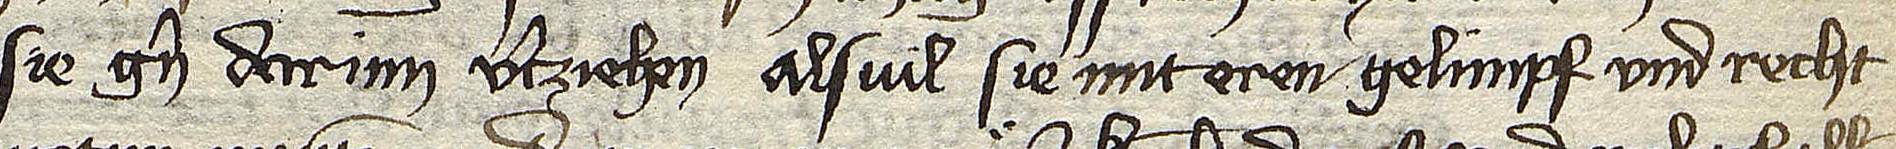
ſie g*n darinn v*cʒiehen alſuil ſie mit eren gelimpf vnd recht
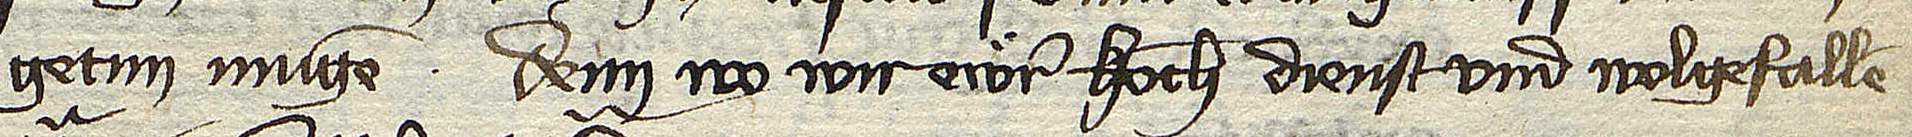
getun muge* denn wo wir eẅr* hoch* dienſt vnd wolgefalle*
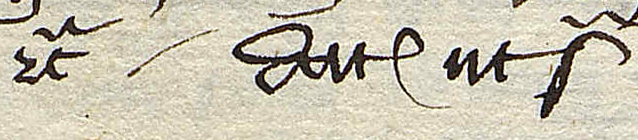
ec* / Dat* ut ſ*
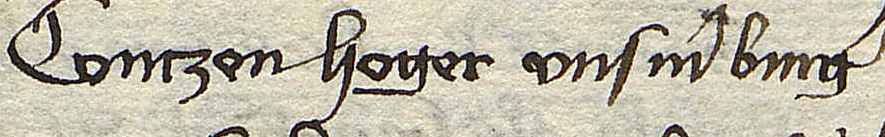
Concʒen hoger vnſm* burg*
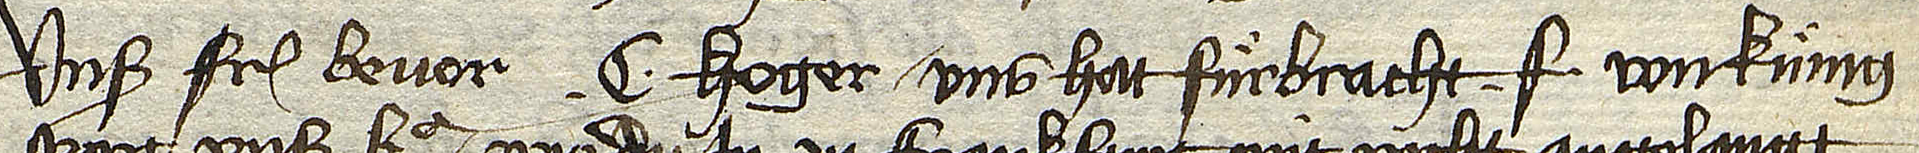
Vnſ* fr* beuor C . hoger / vns hat fürbracht . F. von künig =
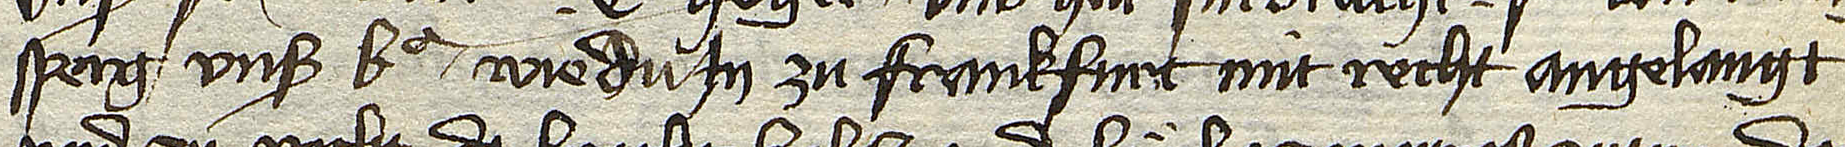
ſperg vnſ* b* / wie du In ʒu frankfurt mit recht angelangt
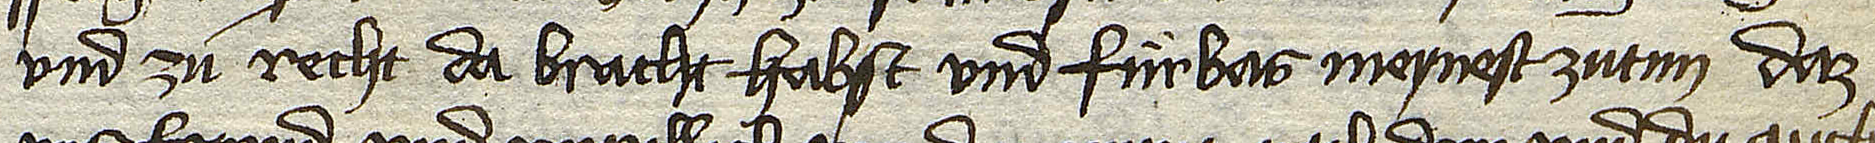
vnd ʒu recht da bracht habſt vnd fürbas meyneſt ʒutun daʒ
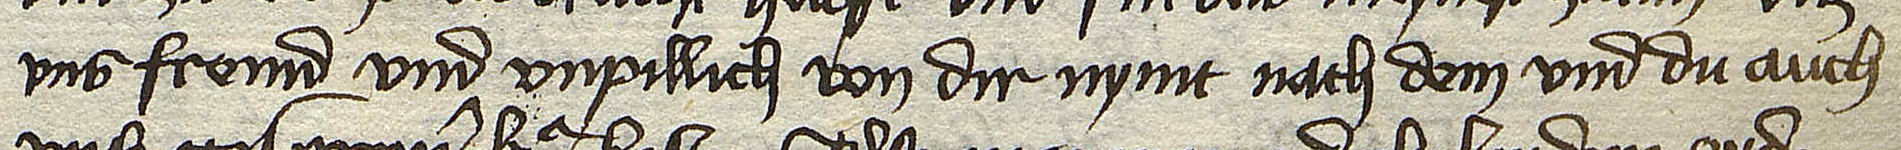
vns fremd vnd vnpillich von dir nymt nach dem vnd du auch
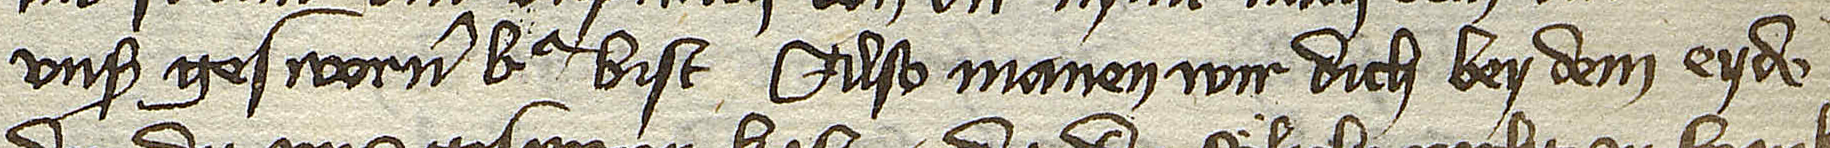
vnſ* geſworn* b* biſt Alſo manen wir dich bey dem eyde
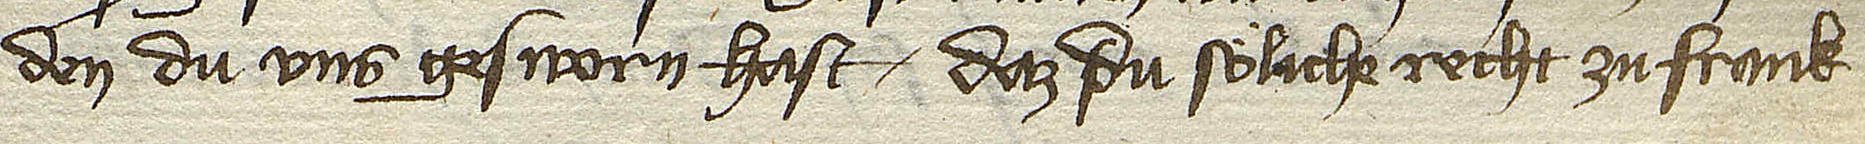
den du vns geſworn haſt / daʒ du ſöliche recht ʒu frank
